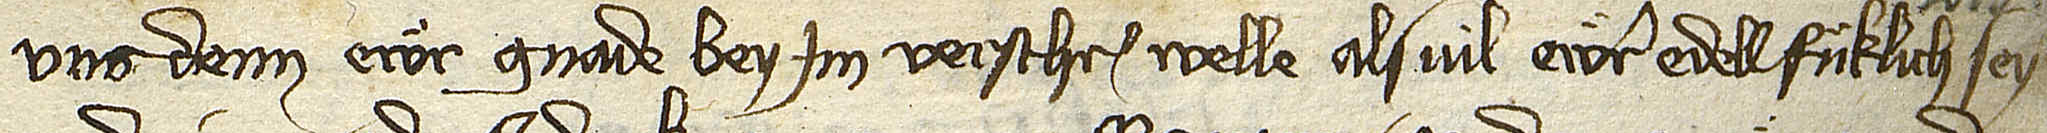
vns denn ewr gnade bey Im verſchr* welle alſuil ewr* edell füklich ſey
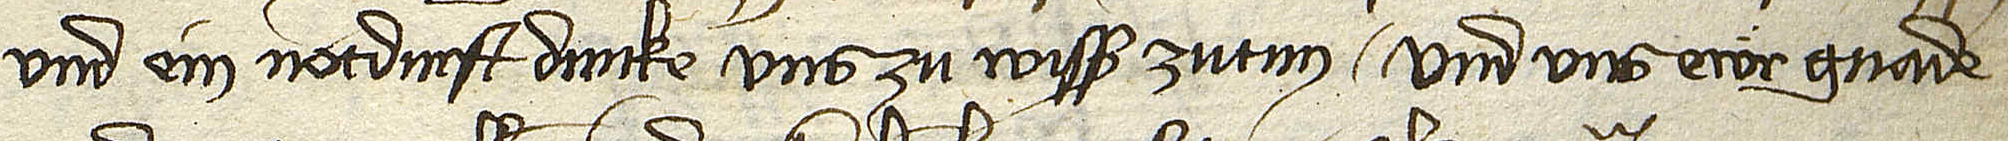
vnd ein notdurft dunke vns ʒu wiſſ* ʒutun / vnd vns ewr gnade
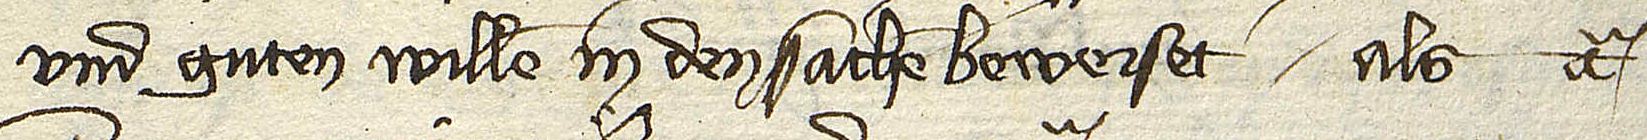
vnd guten wille* in den ſache* beweiſet / als ec*
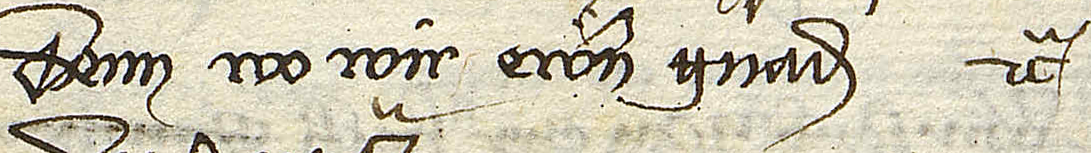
Denn wo wir ew*n gnad* ec*
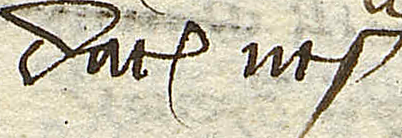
Dat* ut ſ*
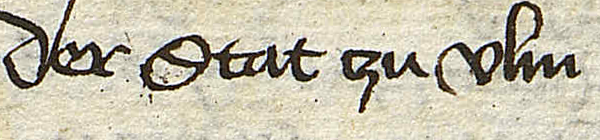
Der Stat cʒu vlm
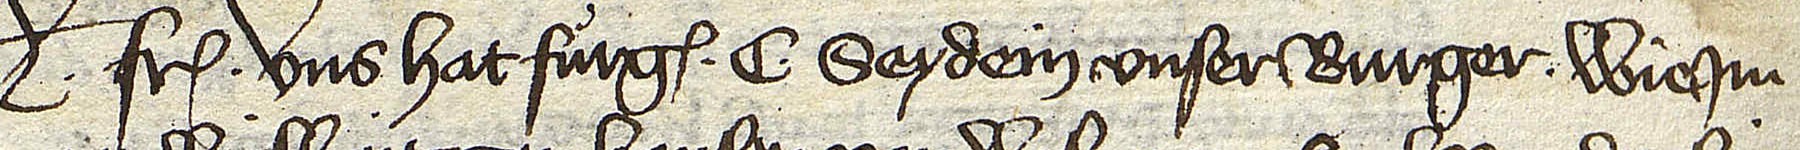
L* fr* . Vns hat fürg* . C . Seydein vnſer Burger . wie Im
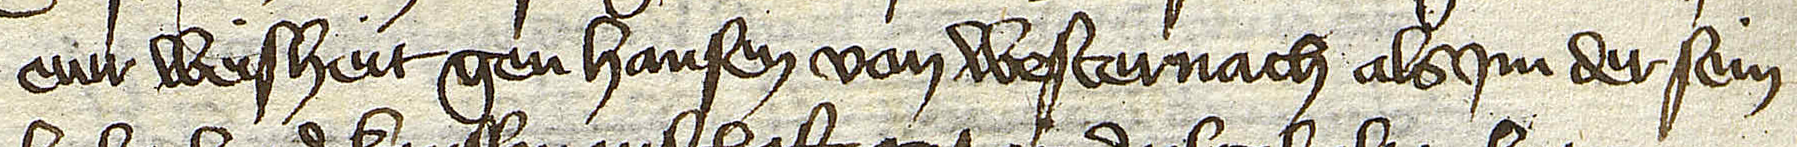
ewr weiſheit gen hanſen von weſternach als Im der ſein
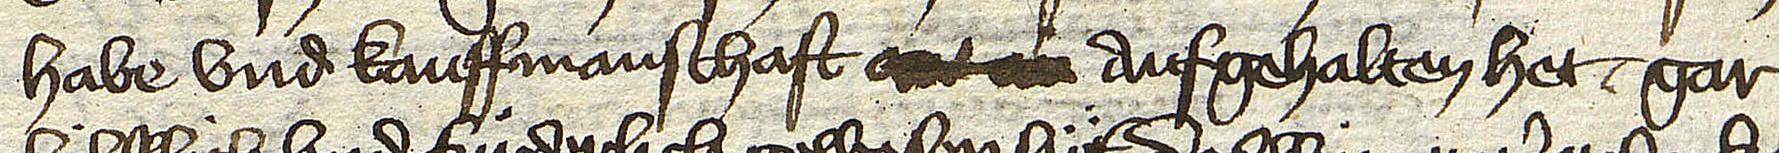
habe vnd kauffmanſchaft %%% %% Aufgehalten het / gar
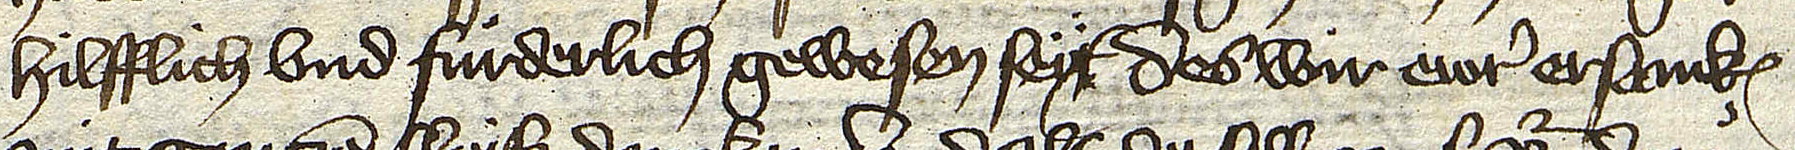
hilfflich vnd fürderlich geweſen ſey / Des wir ew*r erſamk*
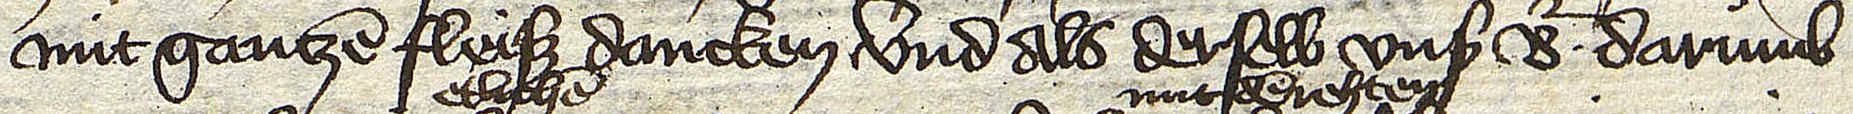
mit gancʒe* fleiſʒ danken / vnd Als derſelb vnſ* B* . darümb
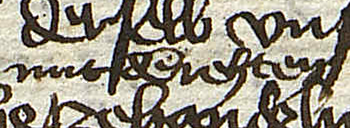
mit de* rehten
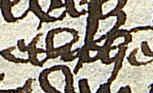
etliche*
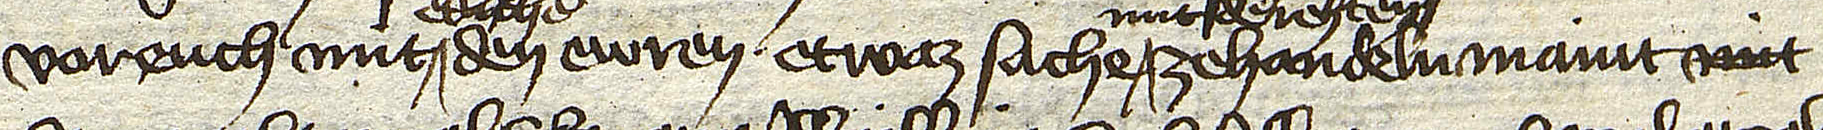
vor euch mit den ewren etwaʒ ſache ʒehandeln maint mit
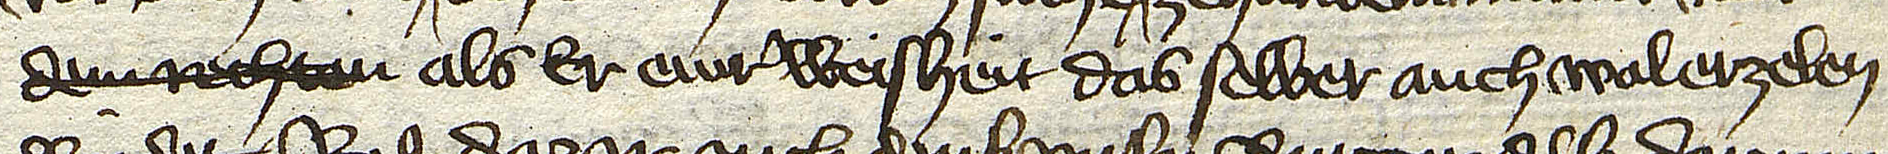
dem rechten als Er ewr* weiſheit das ſelber auch wol erʒelen
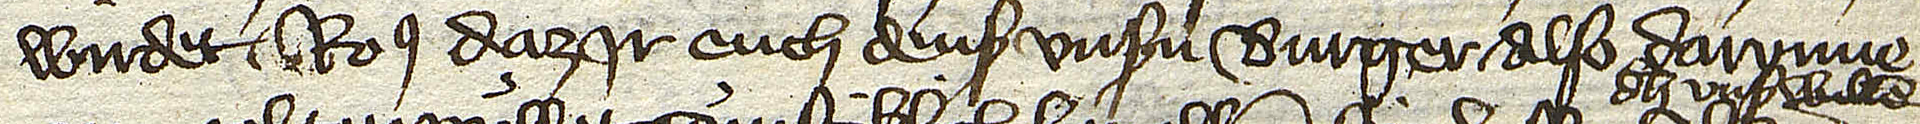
wirdet / Ro* daʒ Ir euch denſ* vnſ*n Burger / Alſo darynne
